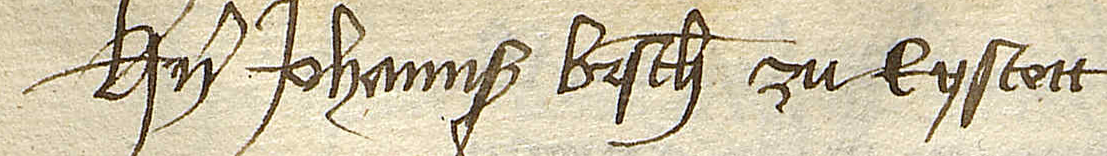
Hn* Iohannſ* biſch* ʒu Eyſtett
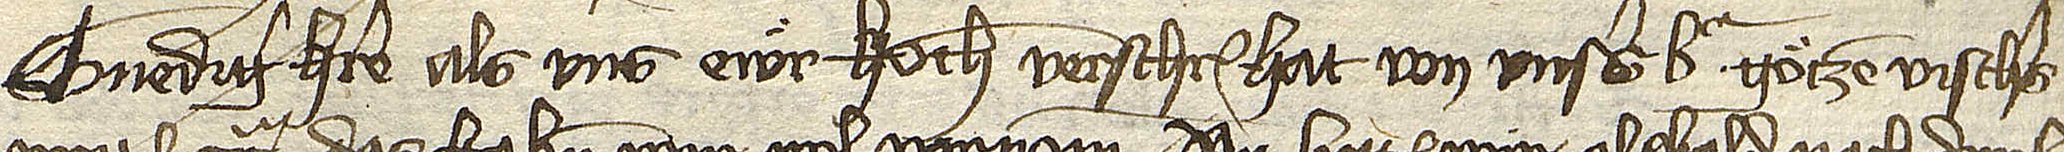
Gnedig* h*re als vns eẅr hoch* verſchr* hat von vnſ*s b* göcʒe* viſch*s
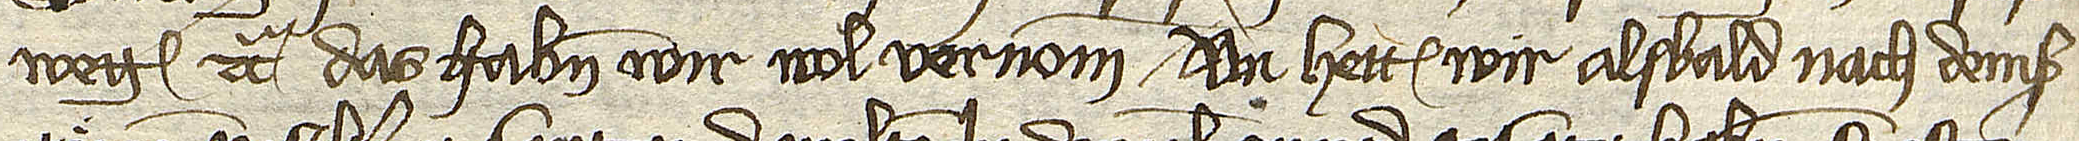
weg* ec* das habn* wir wol vernom* / Nu hett* wir alſbald nach demſ*
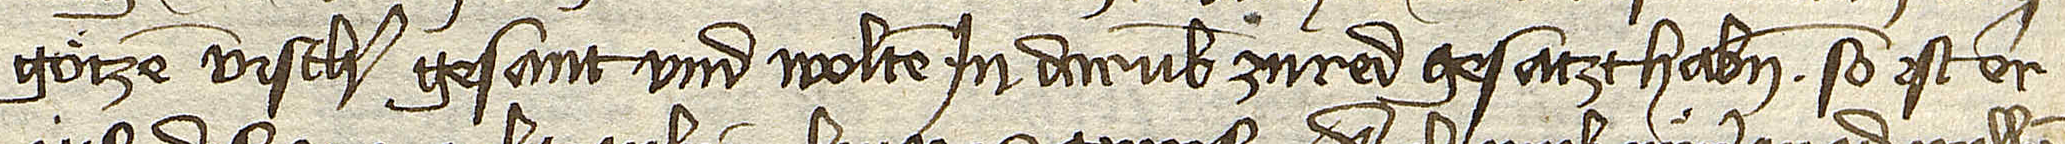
göcʒe* viſch* geſant vnd wolte* In darub* ʒured geſacʒt habn* . ſo iſt er
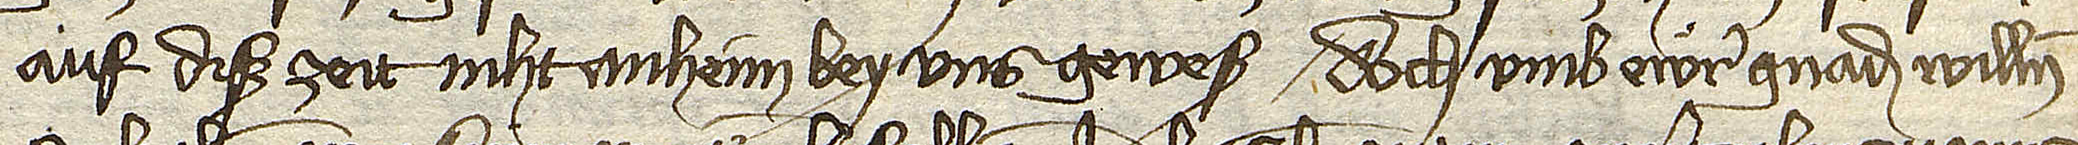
auf diſʒ ʒeit niht anheim bey vns geweſ* / Doch vmb eẅr* gnad* willn*
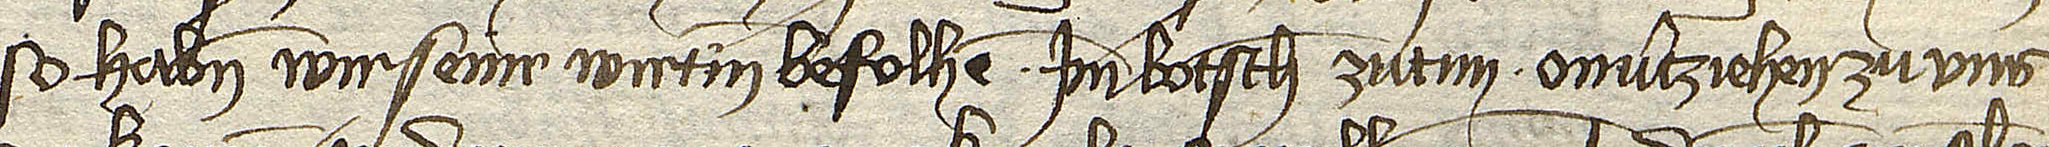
ſo habn* wir ſeinr wirtin* befolhe* . Im botſch* ʒutun . onu*cʒiehen ʒu vns
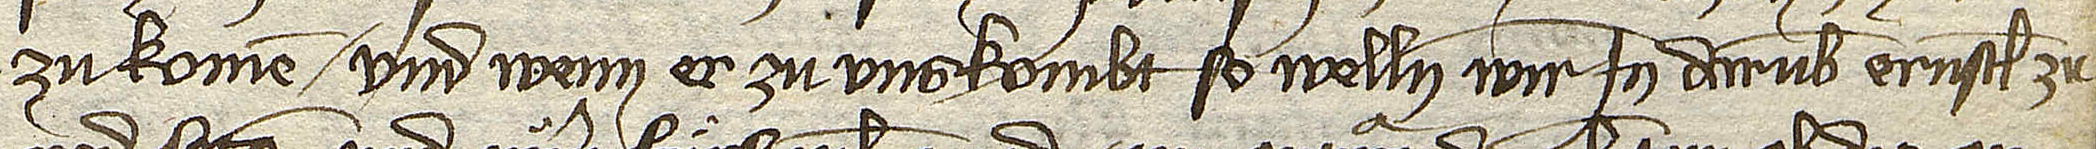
ʒu kome* / vnd wenn er ʒu vns kombt ſo welln* wir In darub* ernſtl* ʒu
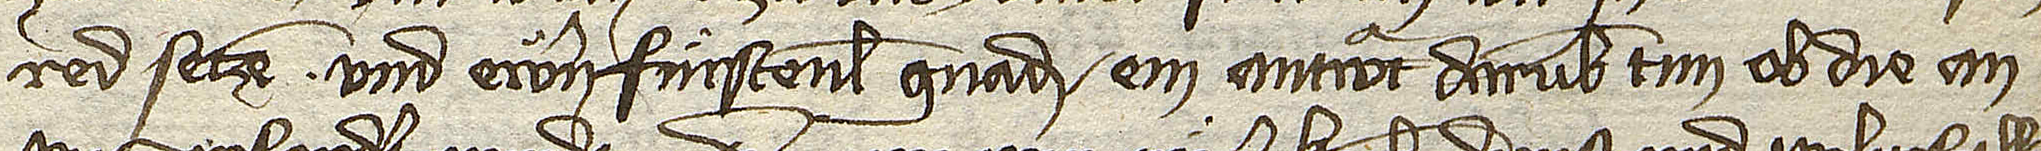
red ſecʒe* . vnd eẅ*n fürſtenl* gnad* / ein antw*t darub* tun ob die an
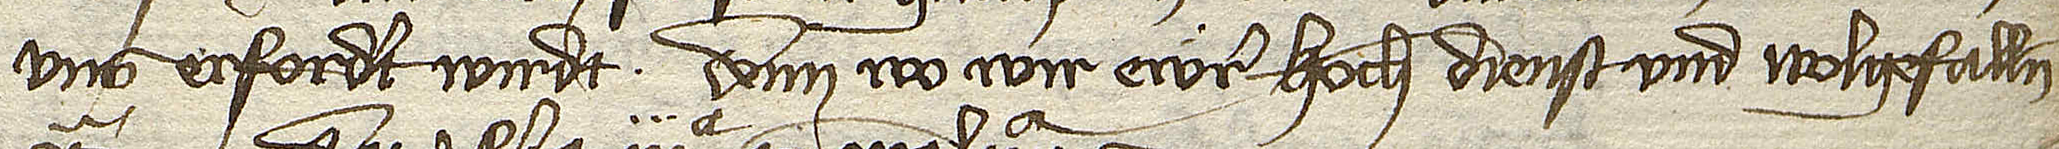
vns erford*t wirdt . Denn wo wir eẅr* hoch* dienſt vnd wolgefalln*
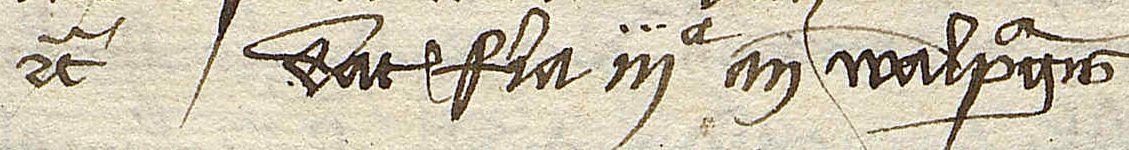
ec* Dat* fi*a iii* an* walp*gis
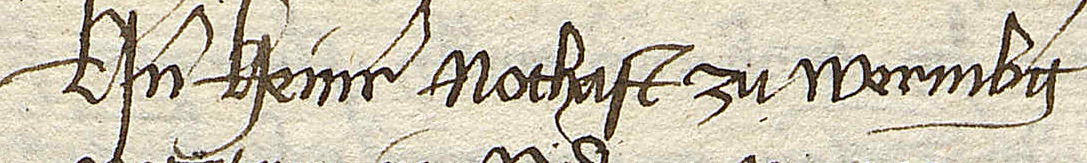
Hn* Heinr* Nothaft ʒu Wermb*g
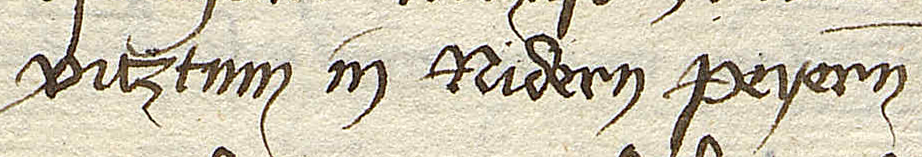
vicʒtum in Nidern Peyern
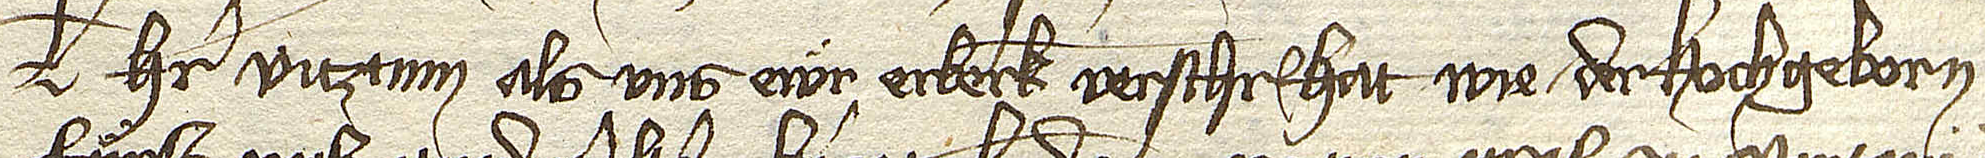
L* hr* vicʒtum als vns eẅr erberk* verſchr* hat wie / der Hochgeborn
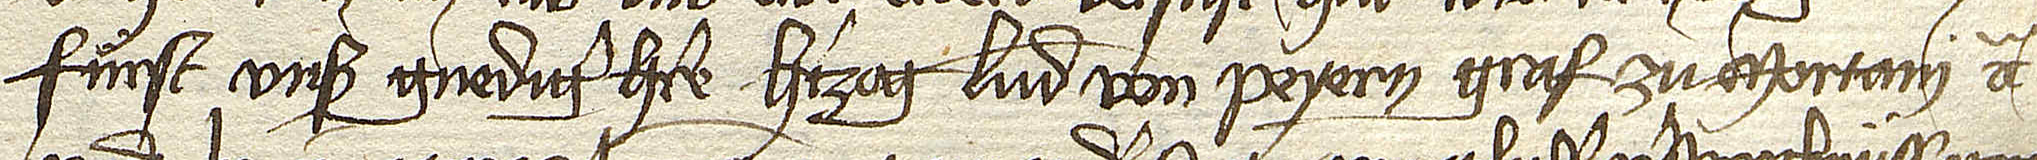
fürſt vnſ* gnedig* h*re / h*cʒog lud* von Peyern graf ʒu Mortani ec*
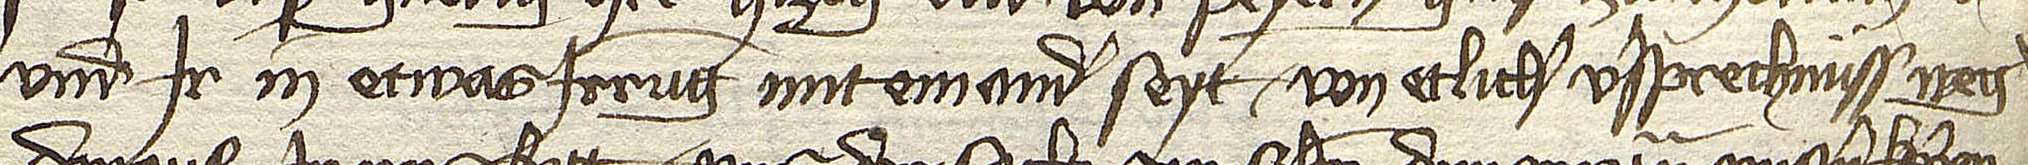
vnd Ir in etwas Irru*g mit ein and* ſeyt / von etlich* v*ſprechnüſſ weg*
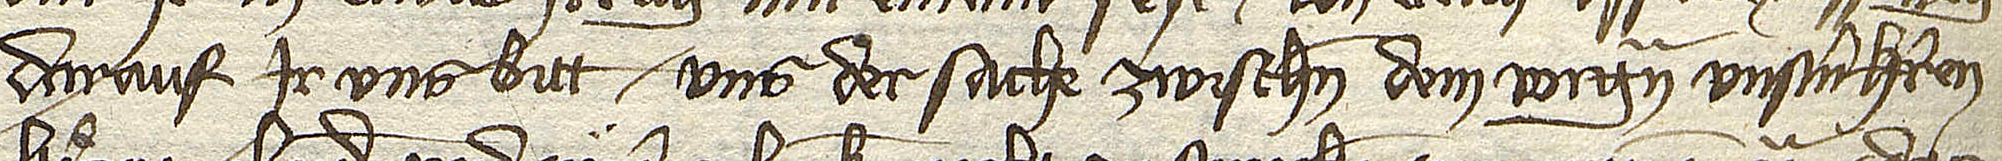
Darauf Ir vns bitt / vns der ſache ʒwiſchn* dem vorgn* vnſm* h*ren
